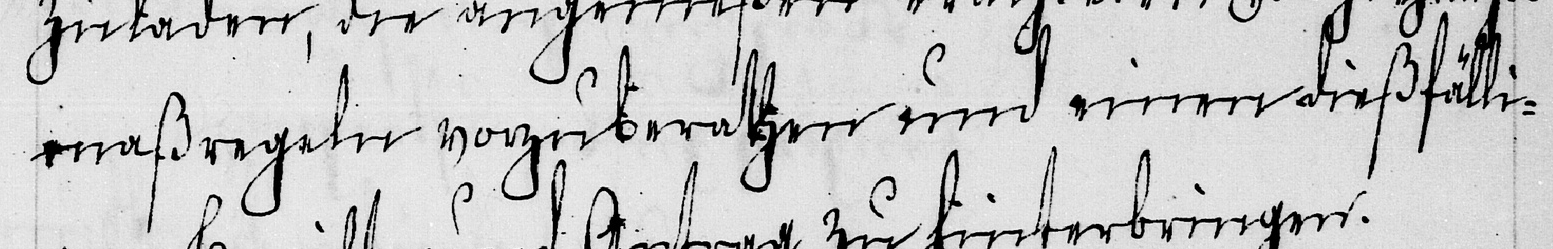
maßregeln vorzuberathen und einen dießfälli¬
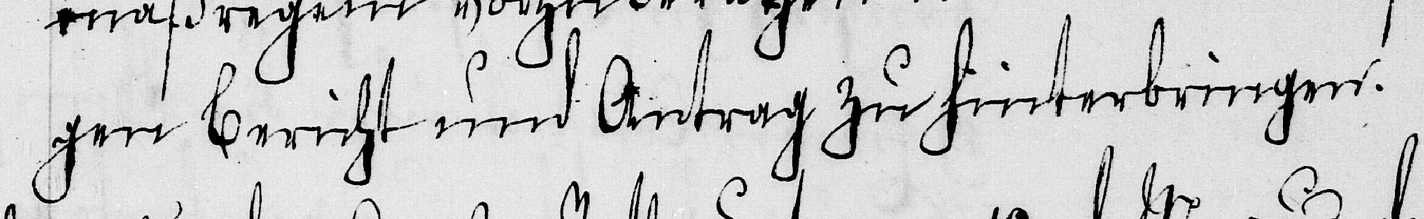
gen Bericht und Antrag zu hinterbringen.
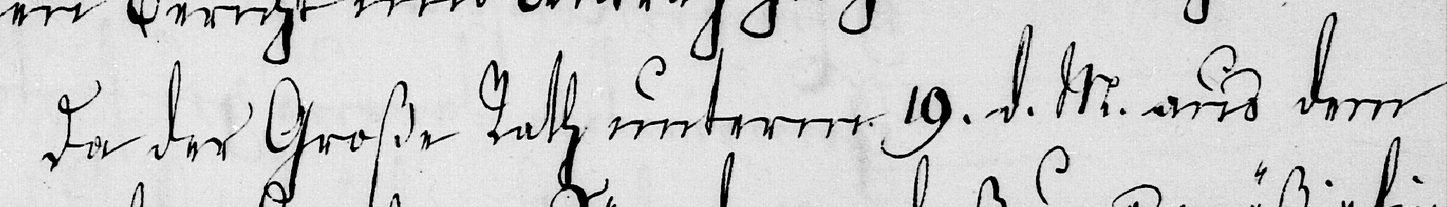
Da der Große Rathe unterm 19. d. M. aus dem
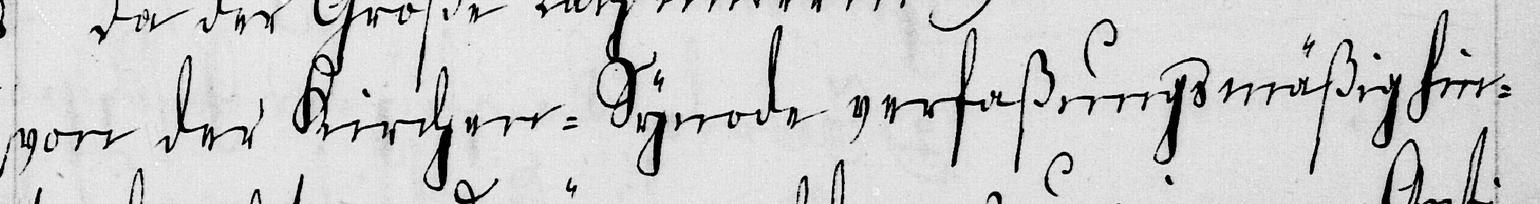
von der Kirchen-Synode verfaßungsmäßig hin¬
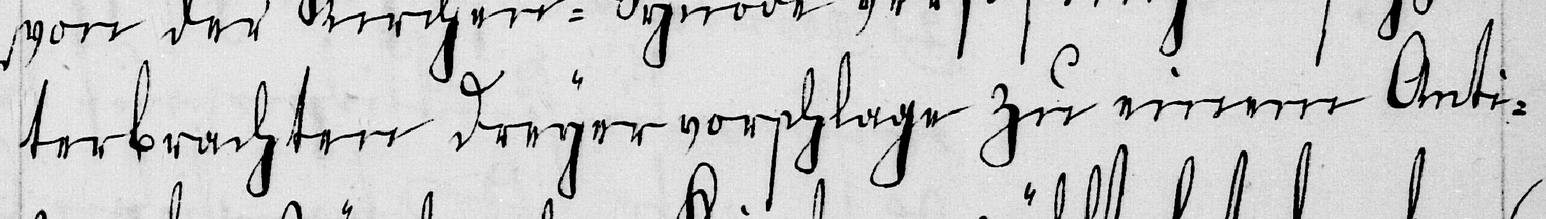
terbrachten Dreyervorschlage zu einem Anti¬
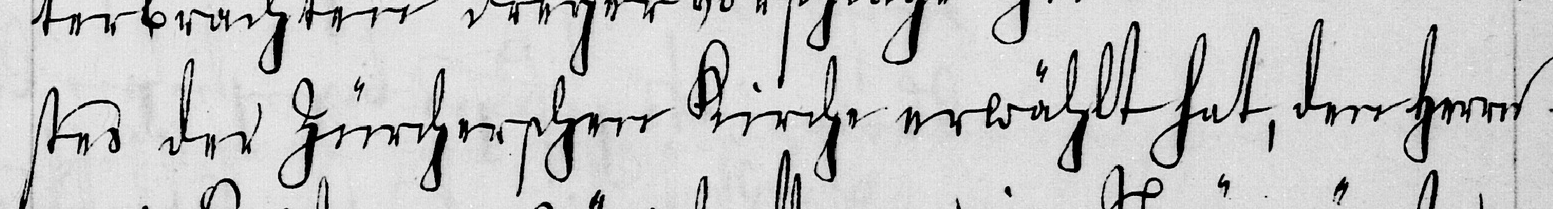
stes der Zürcherschen Kirche erwählt hat, den Herrn
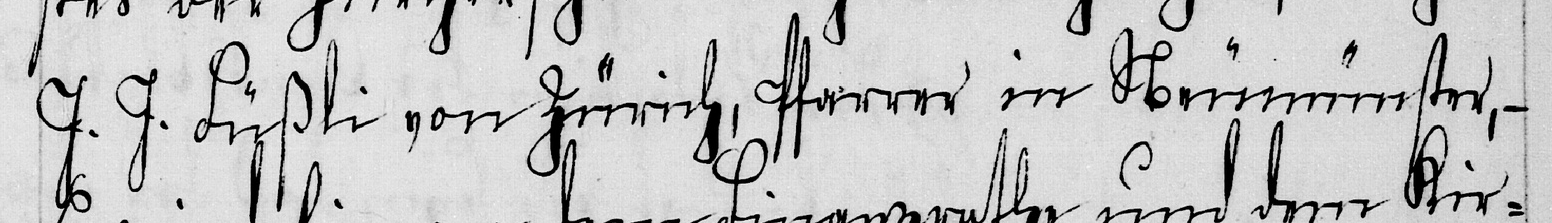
J. J. Füßli von Zürich, Pfarrer in Neumünster, –
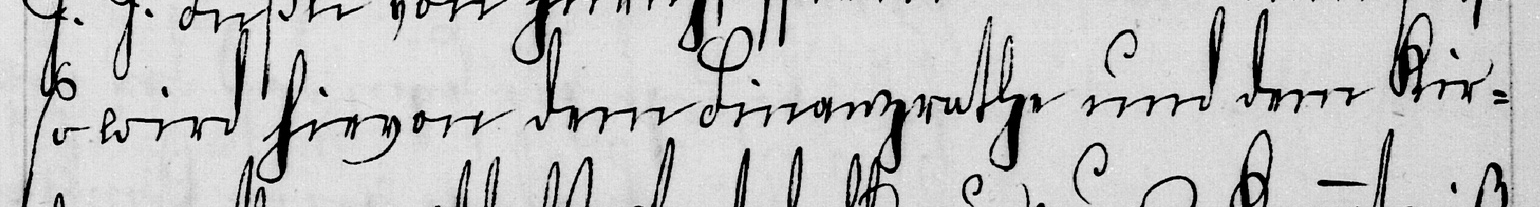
so wird hievon dem Finanzrathe und dem Kir¬
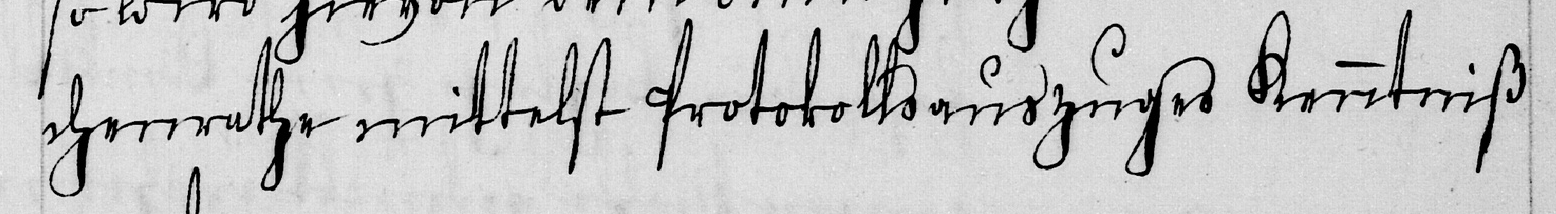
cherathe mittelst Protokollsauszuges Kenntniß
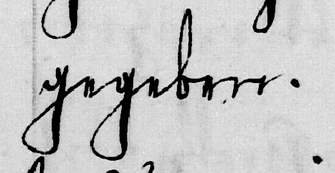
gegeben.
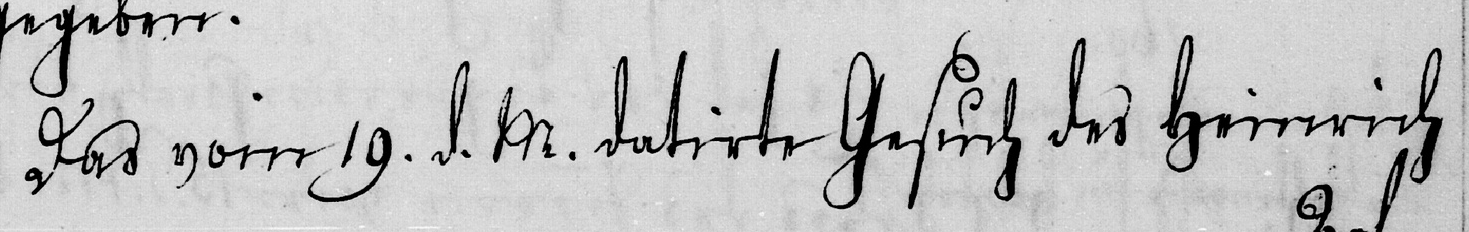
Das vom 19. d. M. datirte Gesuch des Heinrich
